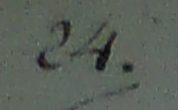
24.
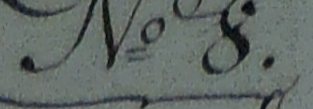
No͇ 8.
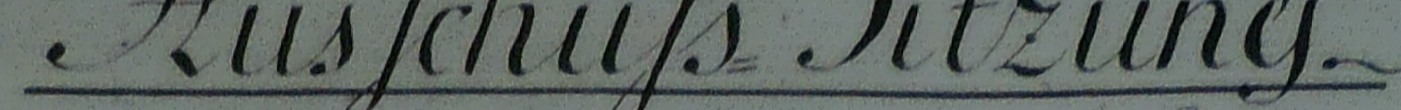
Ausschuss‗ Sitzung
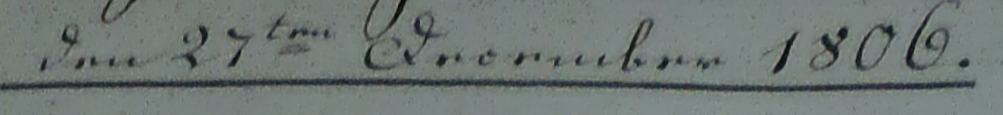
den 27te͇n Dezember 1806.
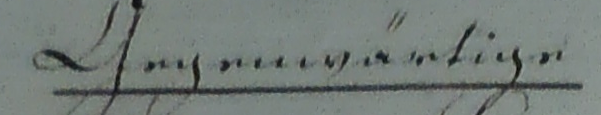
Gegenwärtige
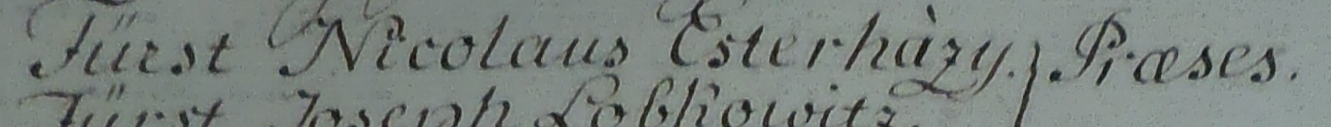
Fürst Nicolaus Esterhàzy. Præses.
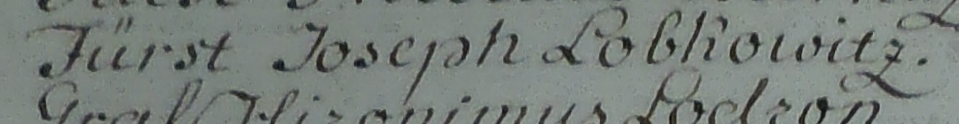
Fürst Joseph Lobkowitz.
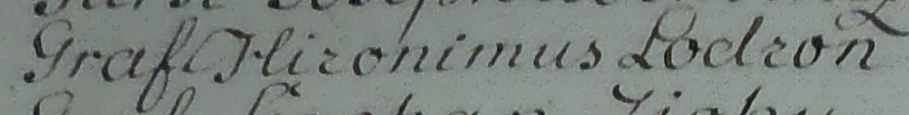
Graf Hironimus Lodron
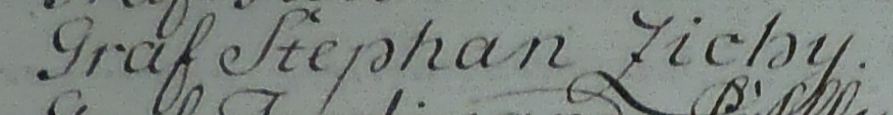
Graf Stephan Zichy.
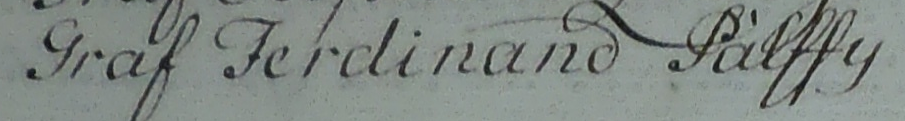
Graf Ferdinand Pàlffy
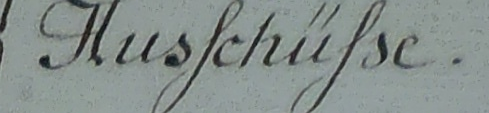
Ausschüsse.
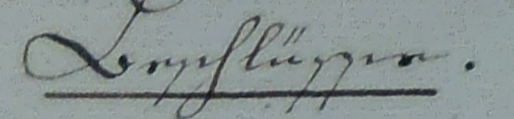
Beschlüsse.
